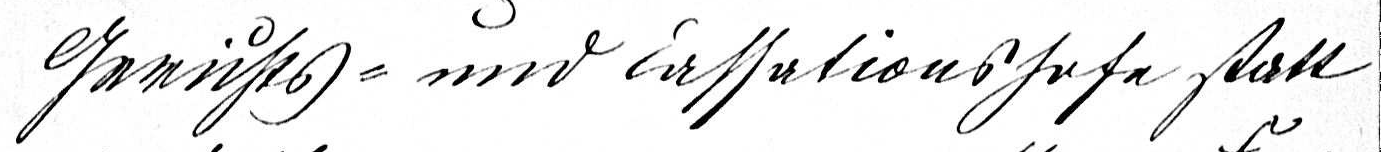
Gerichts- und Cassationshofe statt
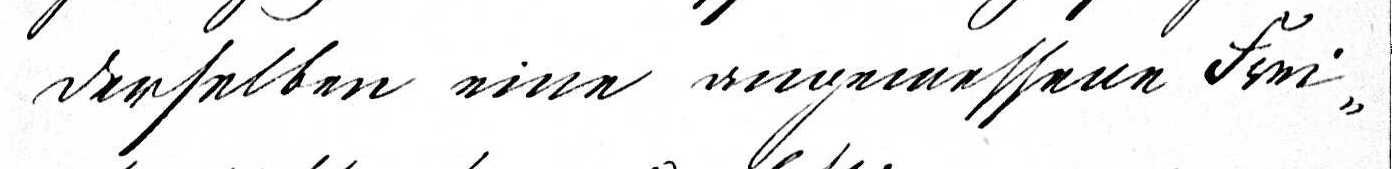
derselben eine angemessen Frei¬
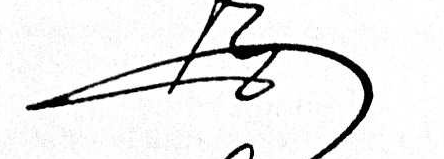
FJ
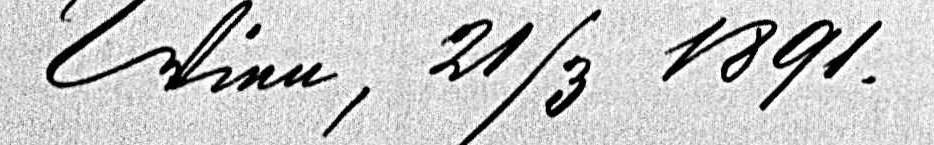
Wien, 21/3 1891
